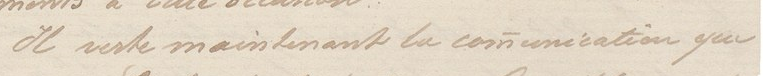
Il reste maintenant la communication que
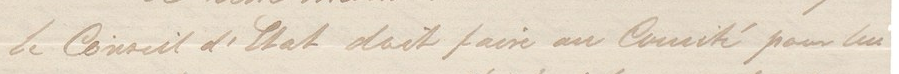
le Conseil d'Etat doit faire au Comité pour lui
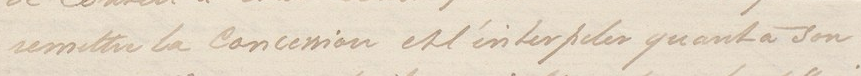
remettre la Concession et l'interpeler quant à son
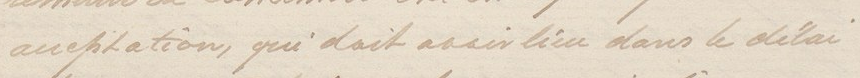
acceptation, qui doit avoir lieu dans le délai
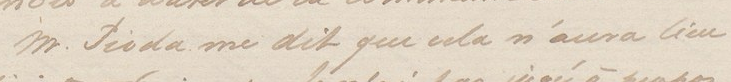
M. Pioda me dit que cela n'aura lieu
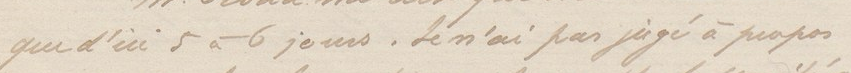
que d'ici5 à 6 jours. Je n'ai pas jugé à propos
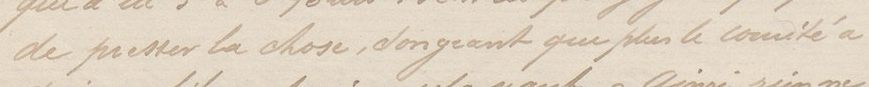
de presser la chose, songeant que plus le comité a
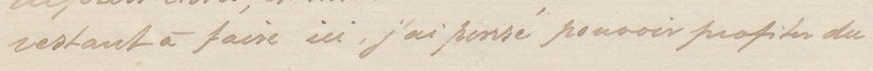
restant à faire ici, j'ai pensé pouvoir profiter du
